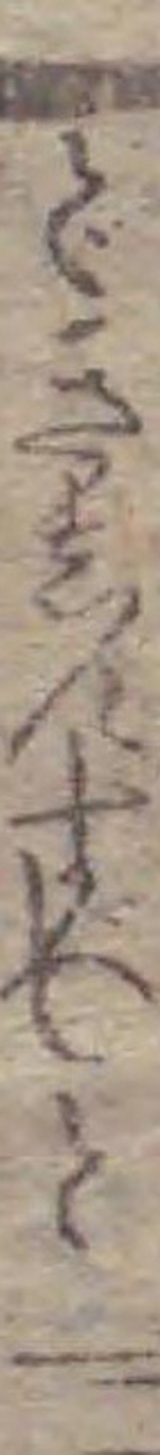どきしんすべしと
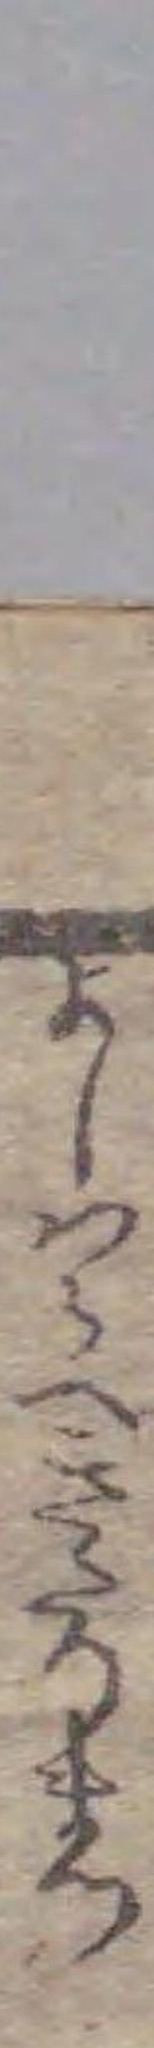よしはらへきたりまつ
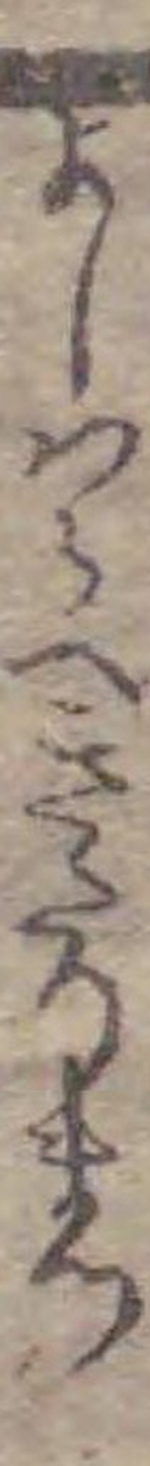よしはらへきたりまつ
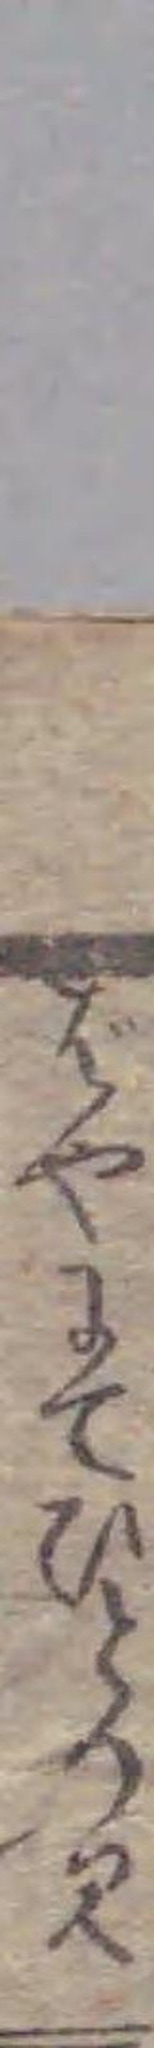ばやにてひとつ見
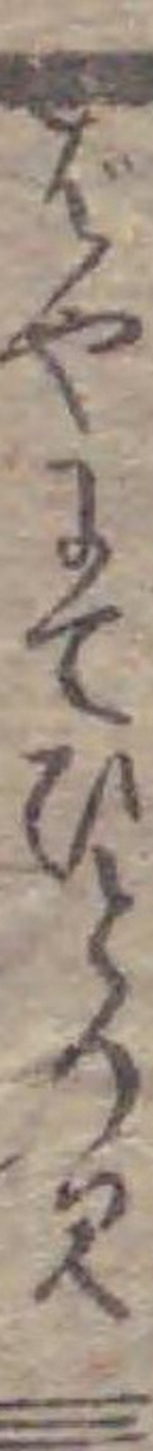ばやにてひとつ見
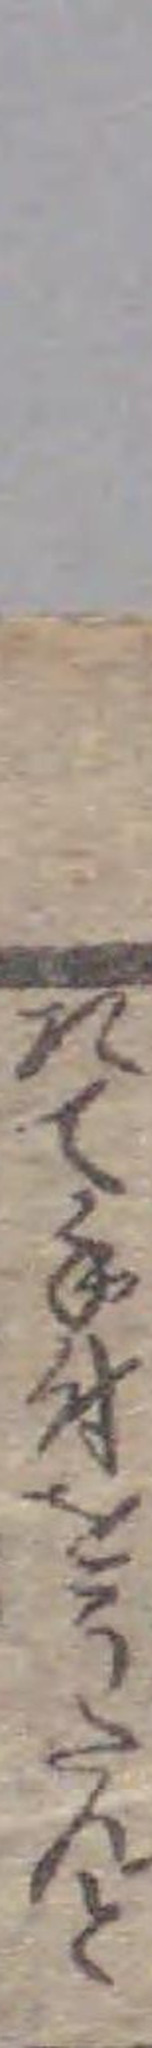たて手付をうたんと
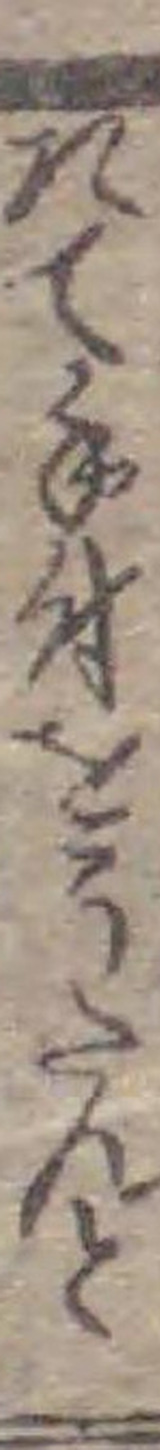たて手付をうたんと
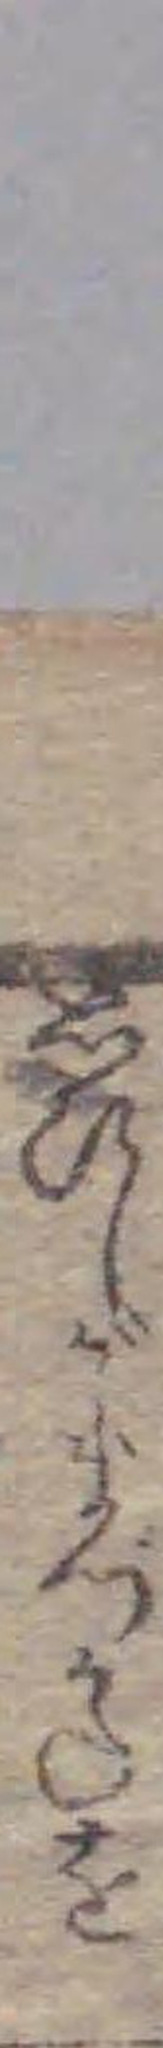思ひしがまづかねを
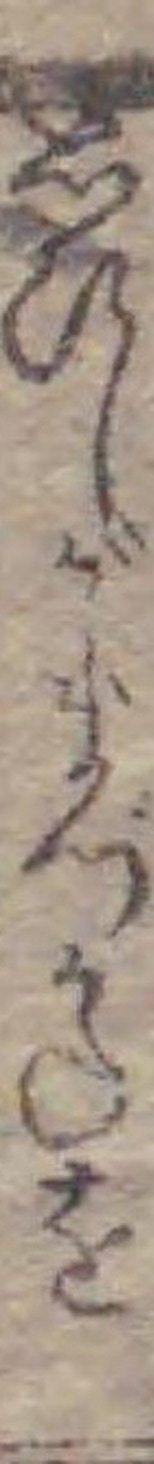思ひしがまづかねを
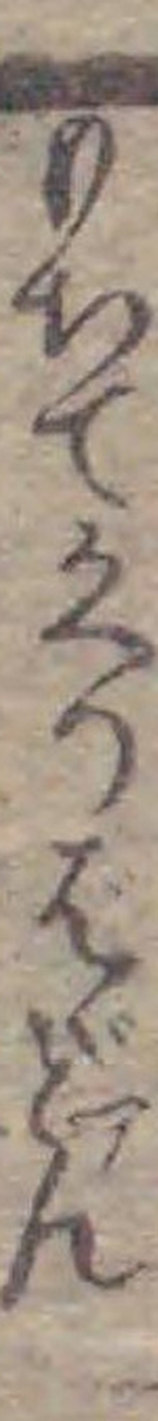もちてかへりばゞァどん
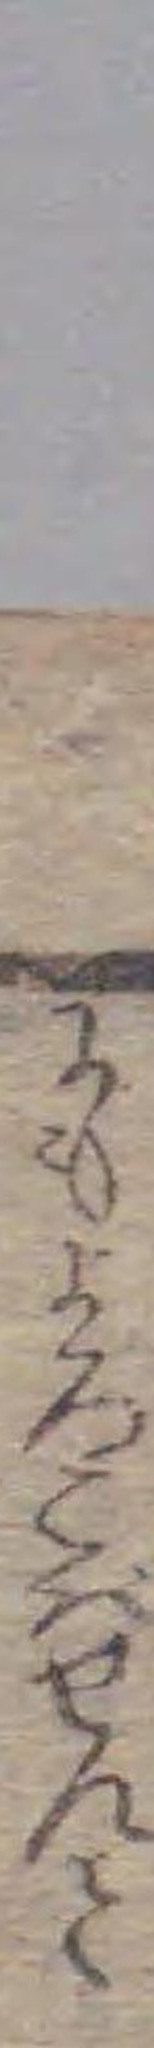にもよろこばせと
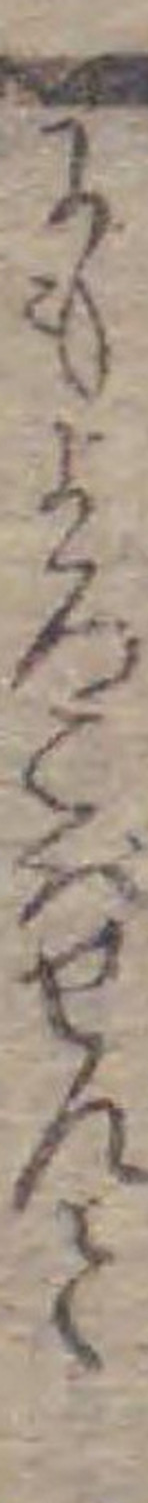にもよろこばせと
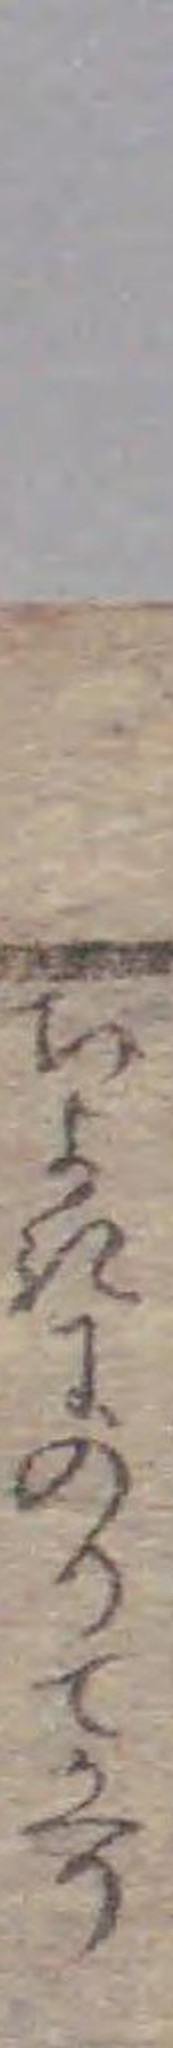ちよきにのりてかへり
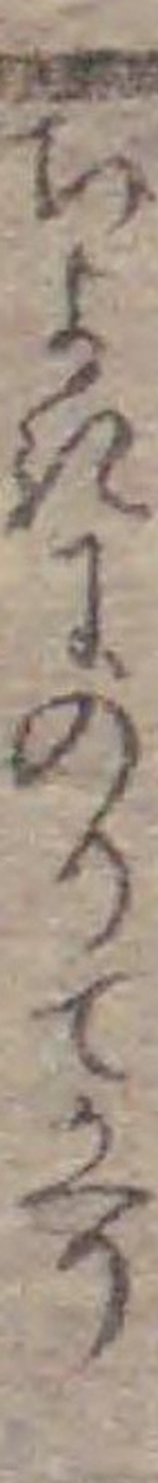ちよきにのりてかへり
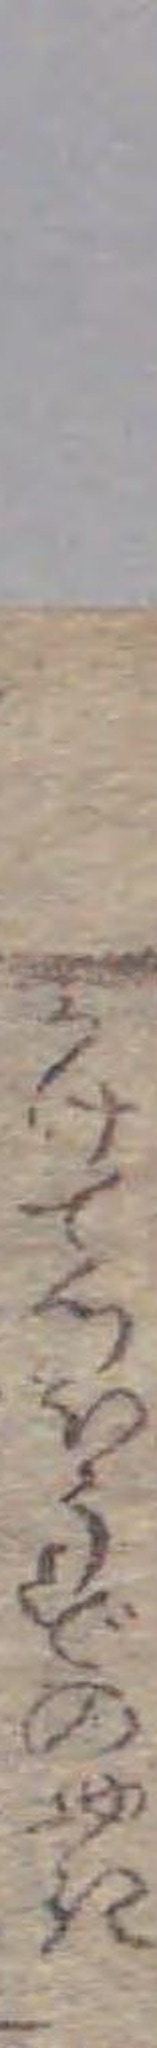かけてつほうずのおき
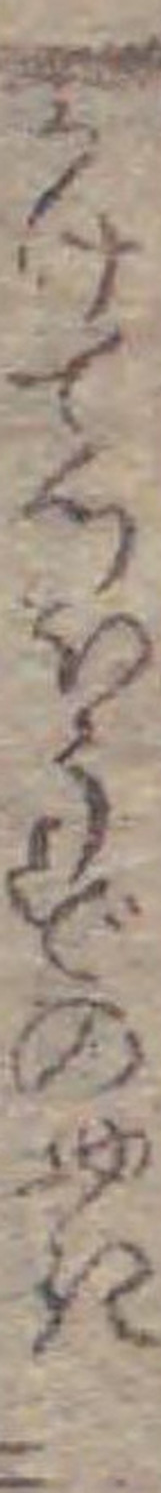かけてつほうずのおき
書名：紺屋百物語 : 3巻
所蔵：国立国会図書館 National Diet Library, JAPAN
